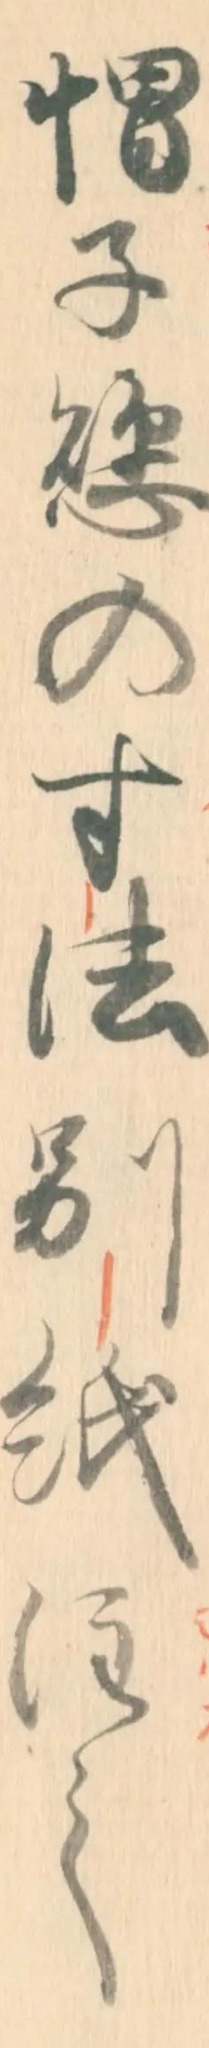帽子懸の寸法弁士に注之

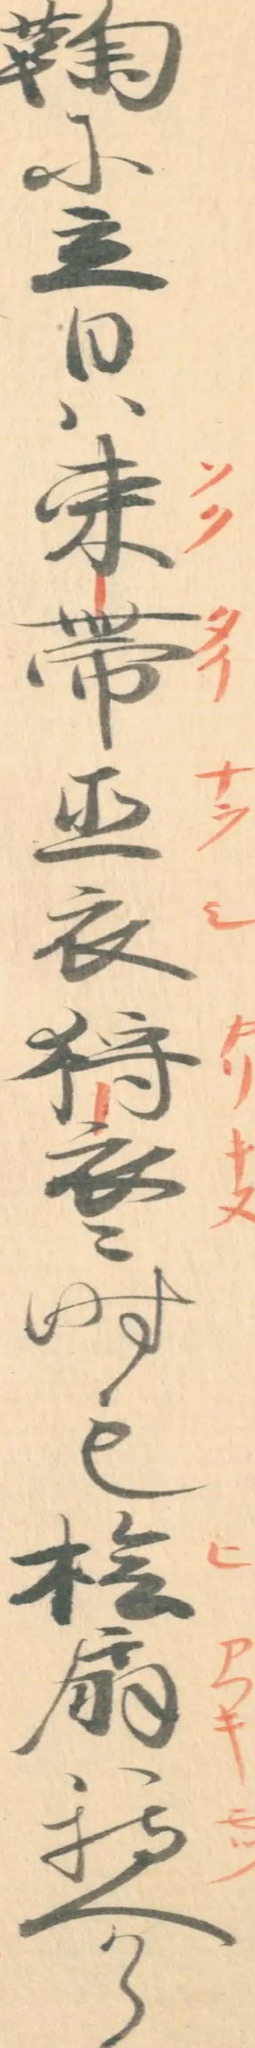鞠に立日は束帯直衣狩衣時も檜扇は持へから
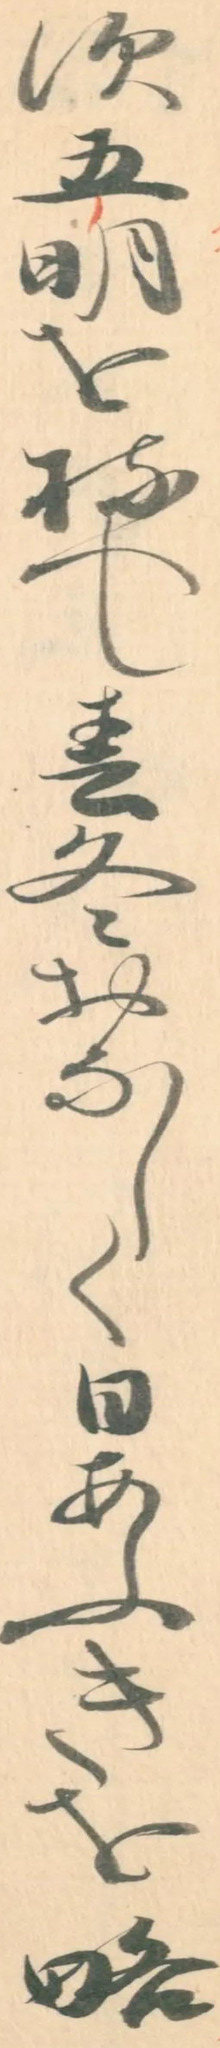す五明を持へし春冬おなしく日あふきを略
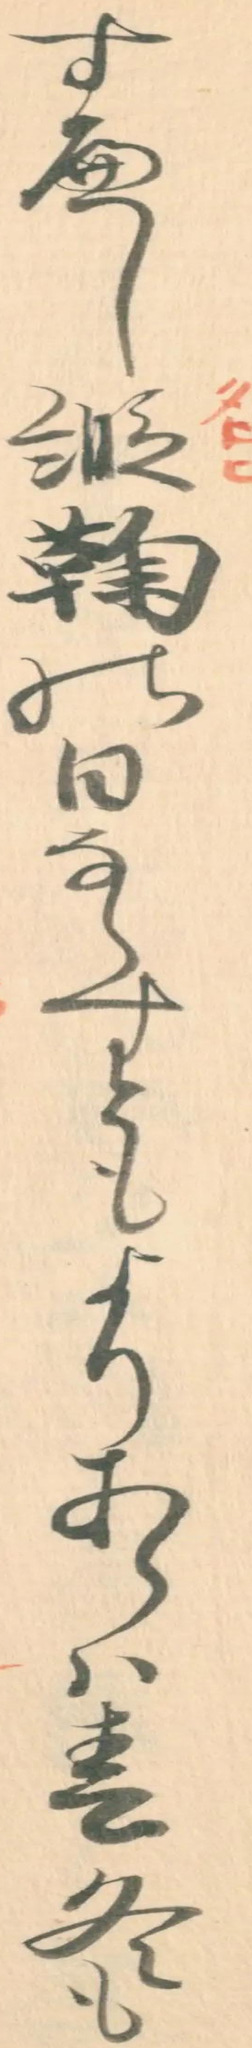すへし鞠の日ならすともよりあらは春冬も
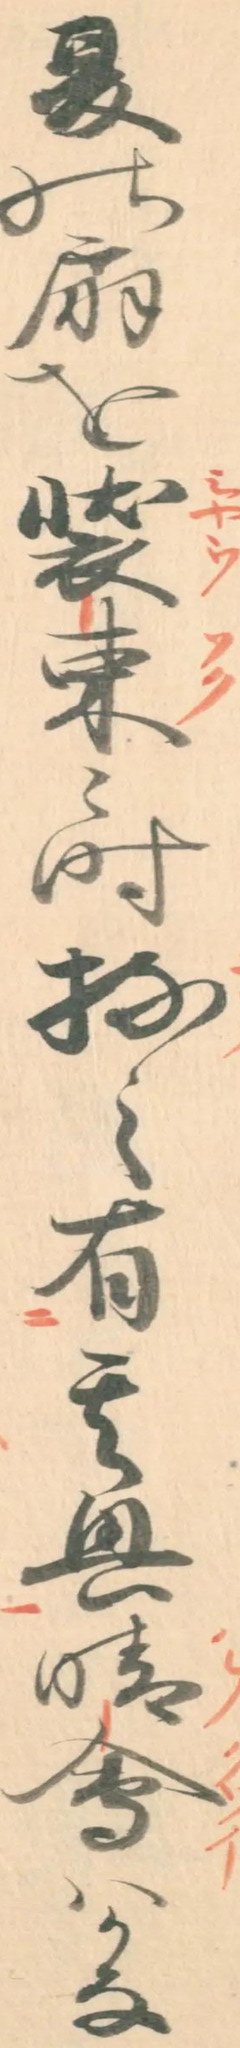夏の扇を装束時持之有其興晴會はかな
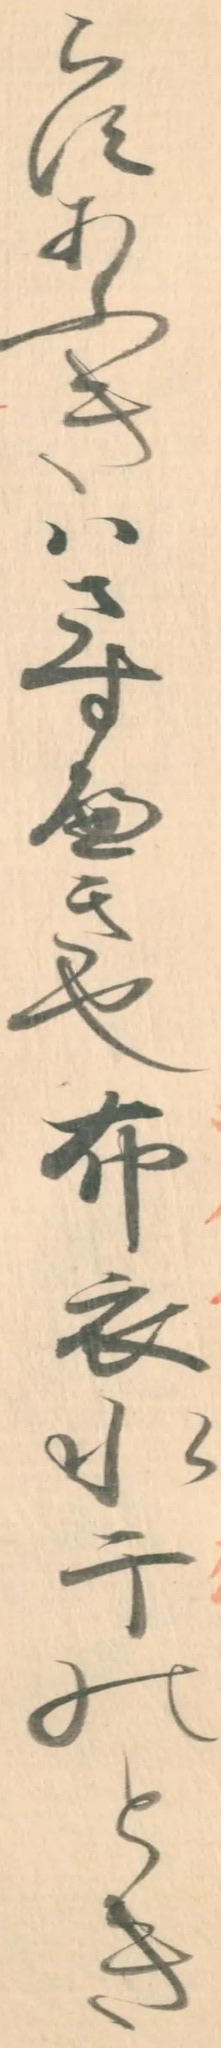らすあふきはさすへき也布衣水干のとき
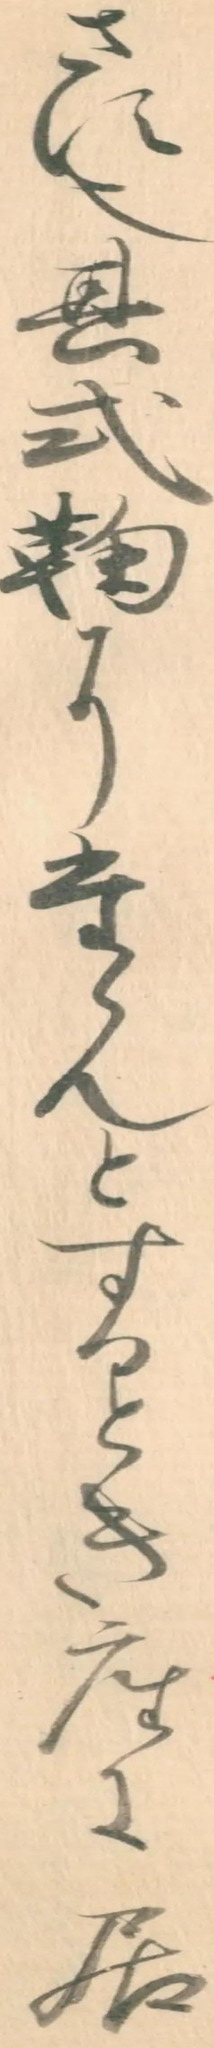さす也其式鞠にけらんとするとき座に居
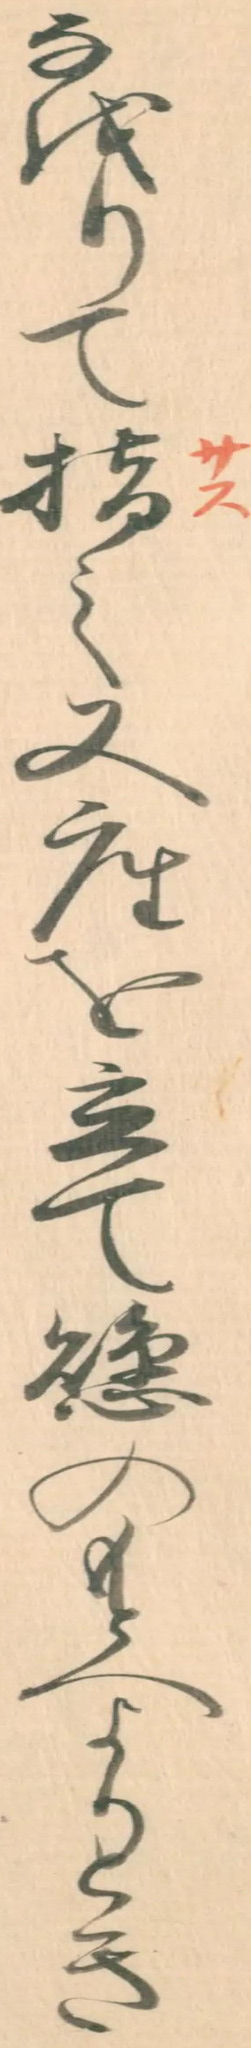なをりて指て又座を立て懸のもとへよりとき
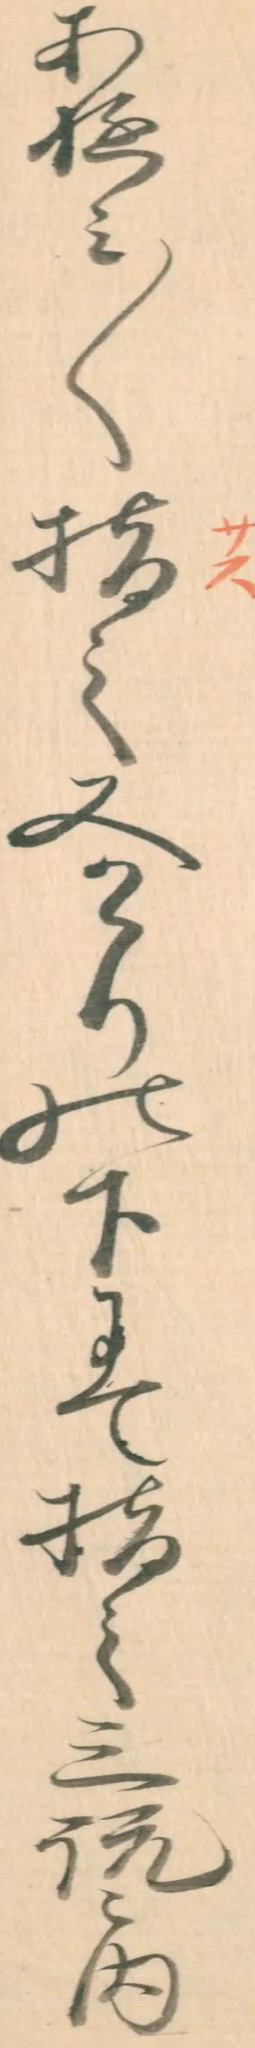あゆみ〳〵指て又かゝりの下にて指て三説内
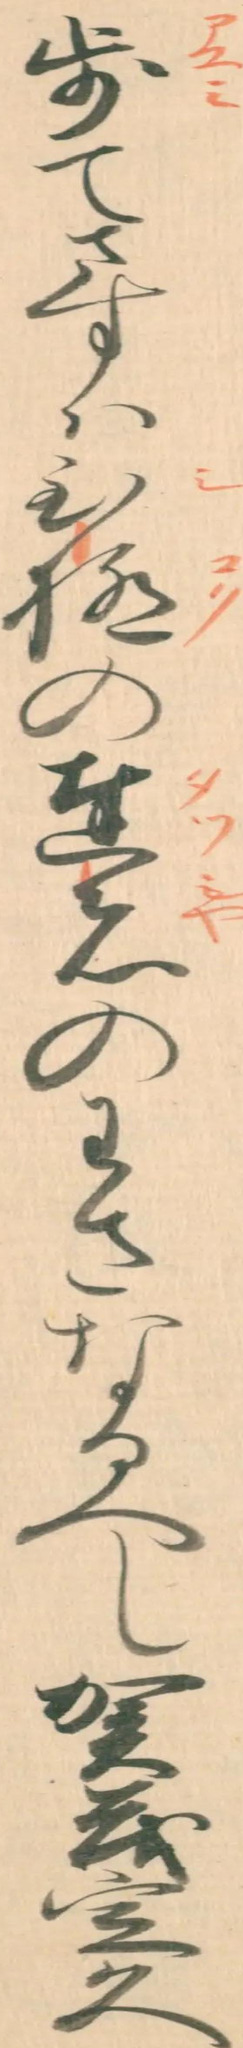歩てさすは至極の達者のわさなるへし加茂宝久
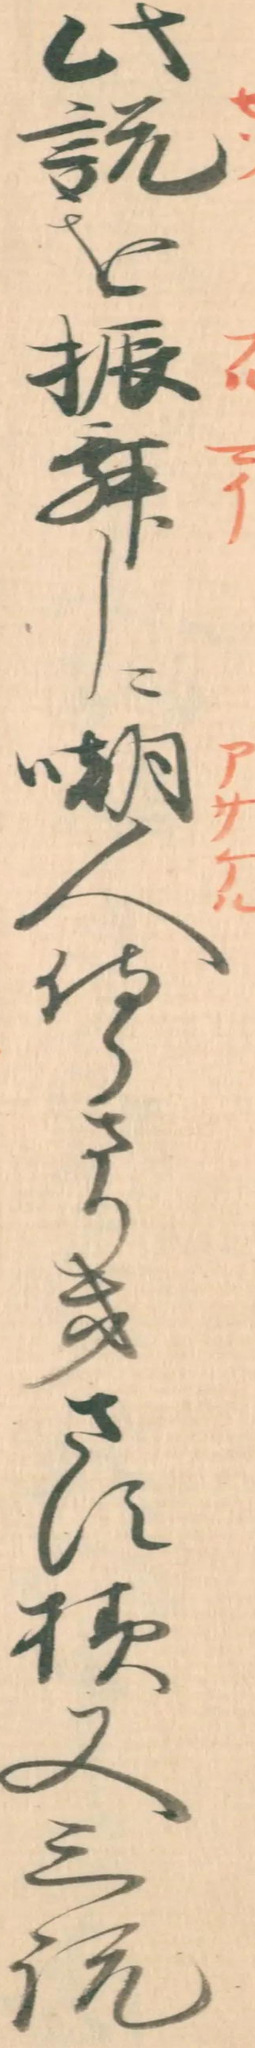此説を振舞しに嘲人侍りたりきさす様三流
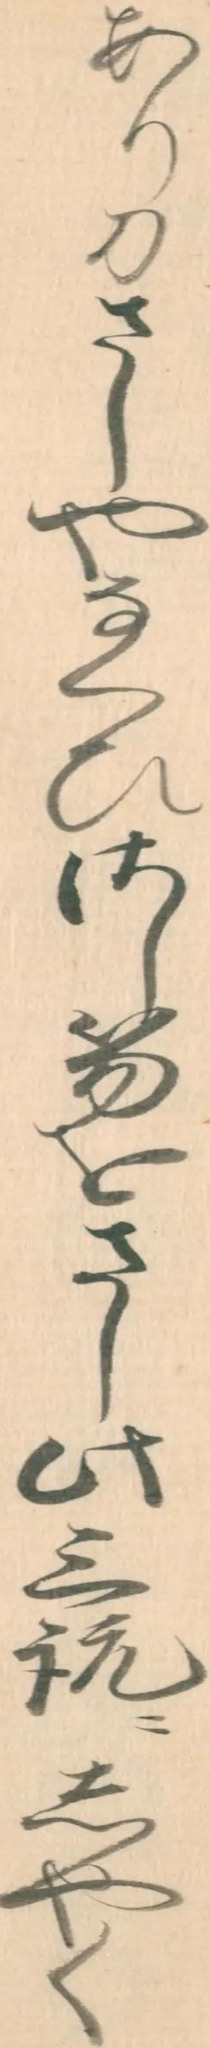あり刀さしてやなくひさし笏をさして此三流にしやく
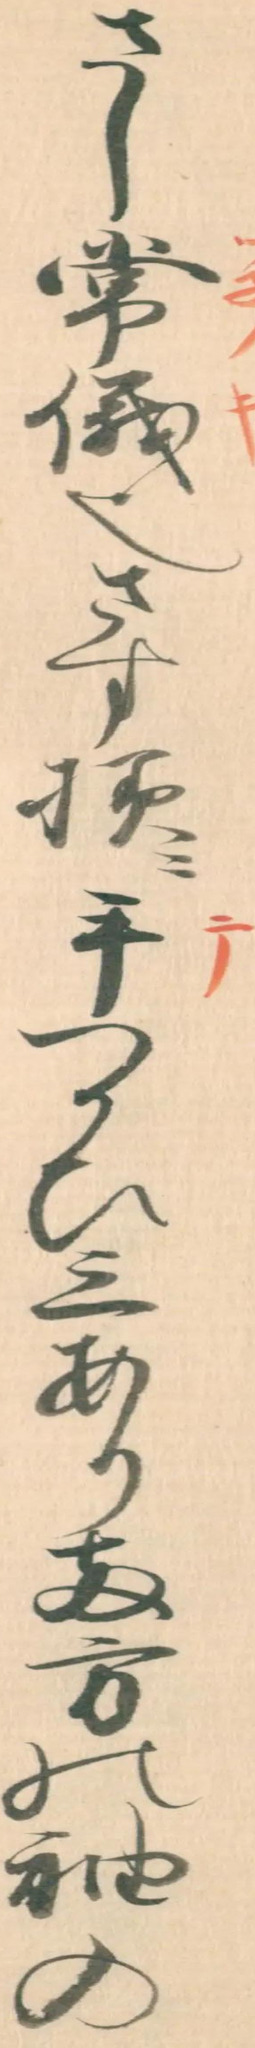さし常儀也さす様に手つかひ三あり両方の袖の
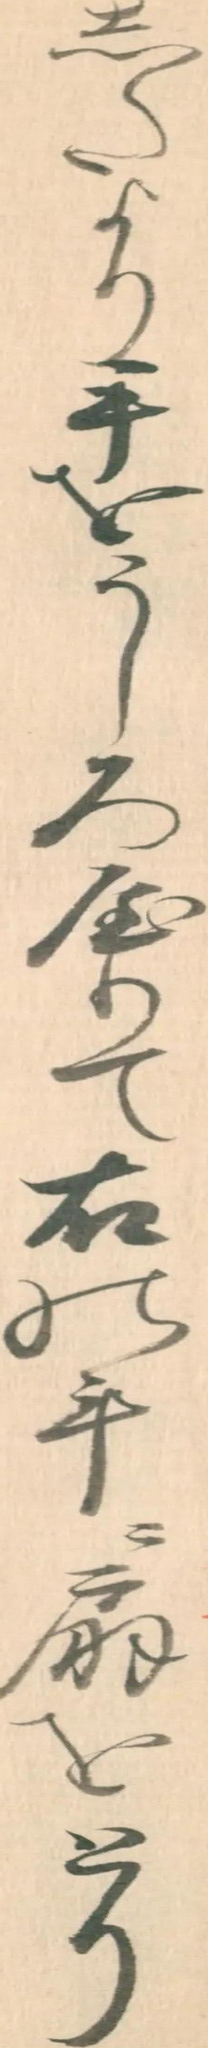したより手をうしろやりて右の手に扇をとり
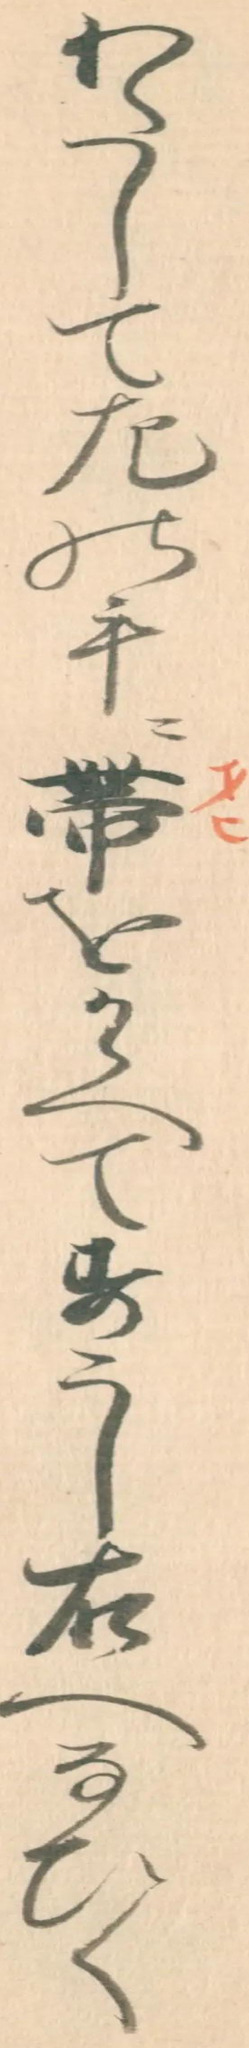わたして左の手に帯をからへてすこし右へなひく
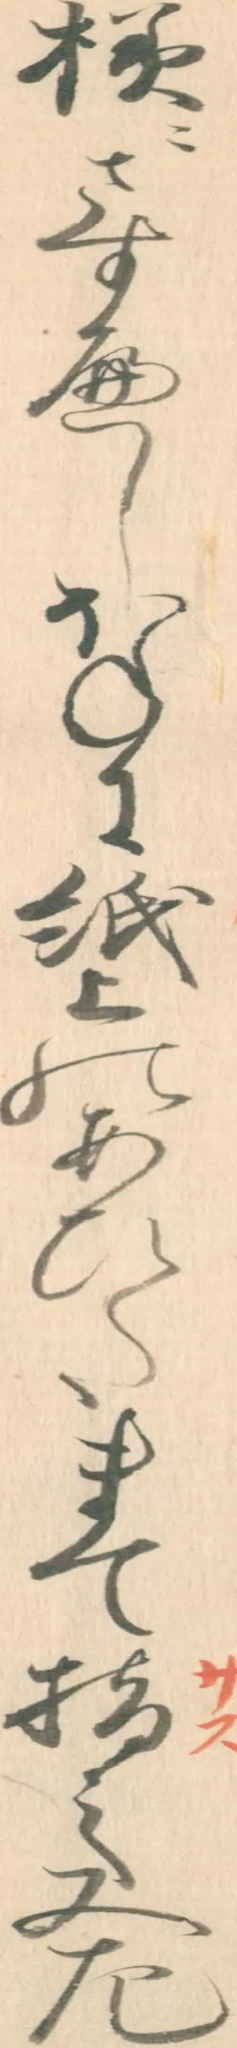様にさすへしほねに紙上のあひたまて指て又左
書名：遊庭秘抄 2巻. [1]
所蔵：国立国会図書館 National Diet Library, JAPAN
